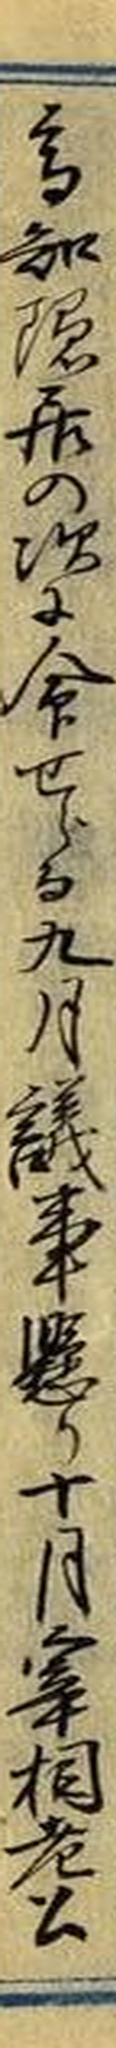高知隠居の次に命せらる九月議事懸り十月宰相老公
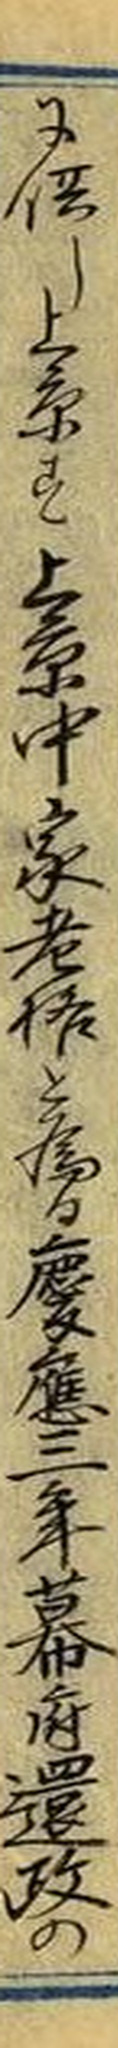に供し上京す上京中家老格と為る慶応三年幕府還政の
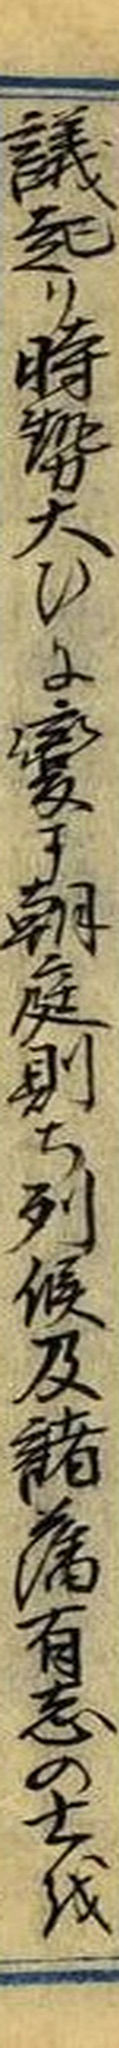議起り時勢大ひに変す朝廷則ち列侯及諸藩有志の士を
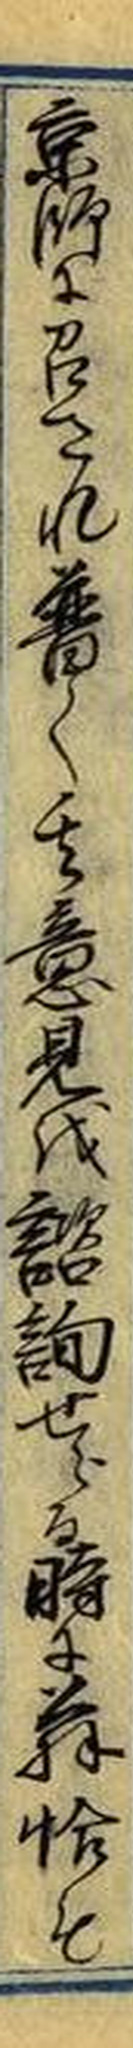京師に召され普く其意見を諮詢せらる時に翁恰も
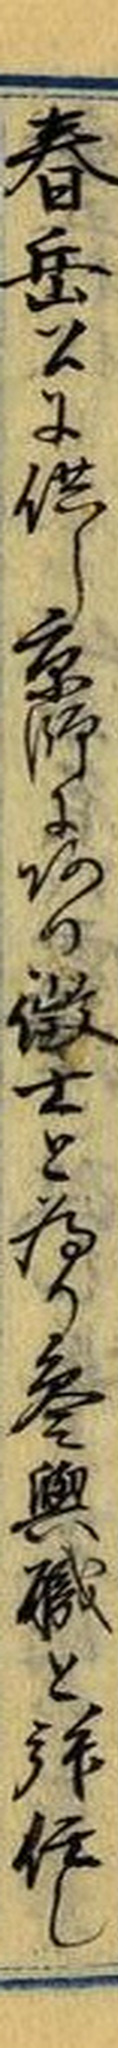春岳公に供し京師にあり徴士と為り参与職と拝任し
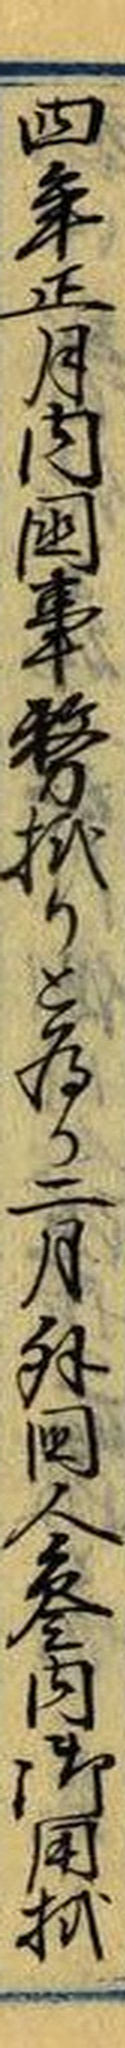四年正月内国事務掛りと為り二月外国人参内御用掛
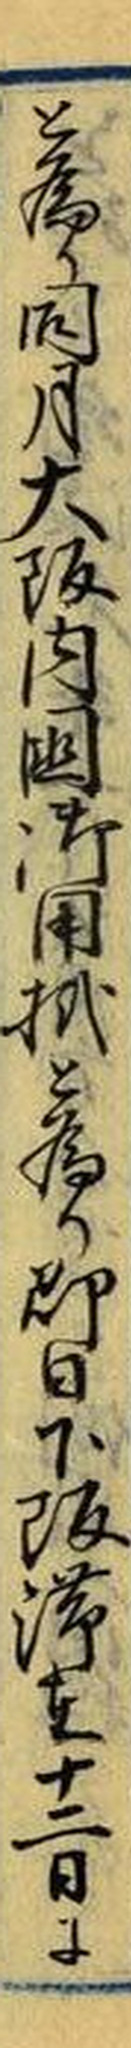と為り同月大阪内国御用掛となり即日下阪滞在十二日に
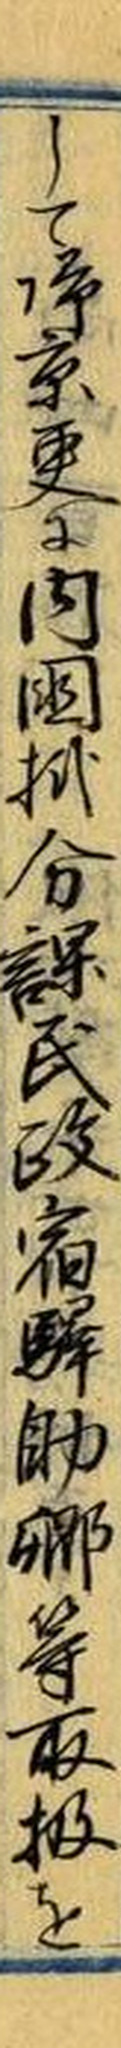して帰京更に内国掛分課民政宿駅助郷等取扱を
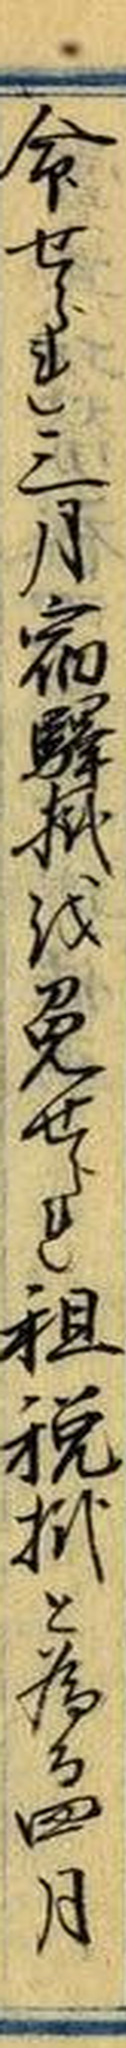命せられ三月宿駅掛を免せられ租税掛と為る四月
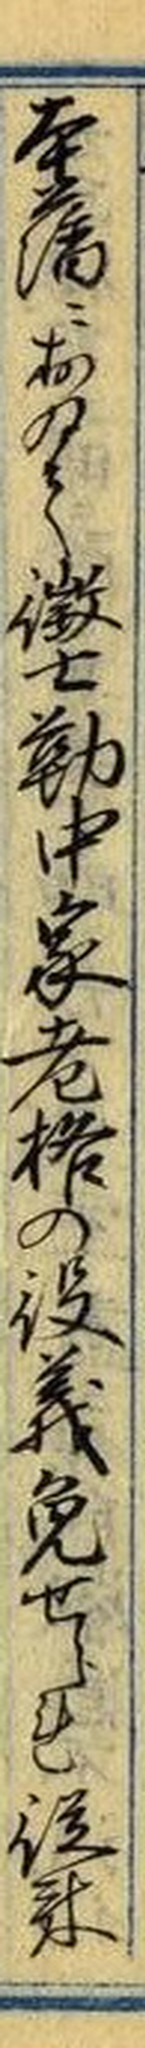本藩ニおゐて微士勤中家老格の役義免せられ従来
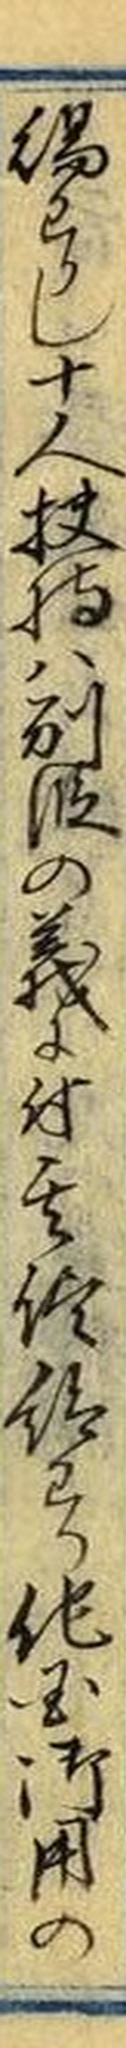賜わりし十人扶持ハ別段の義に付其侭給わり他国御用の
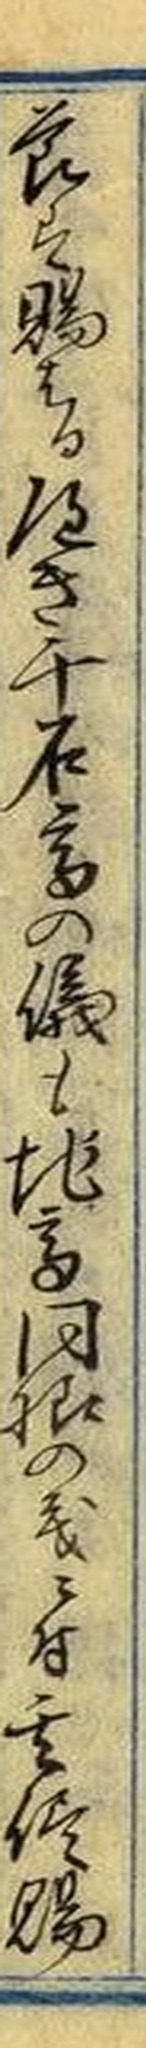節は賜はるへき千石高の儀は地高同様の義ニ付其侭賜
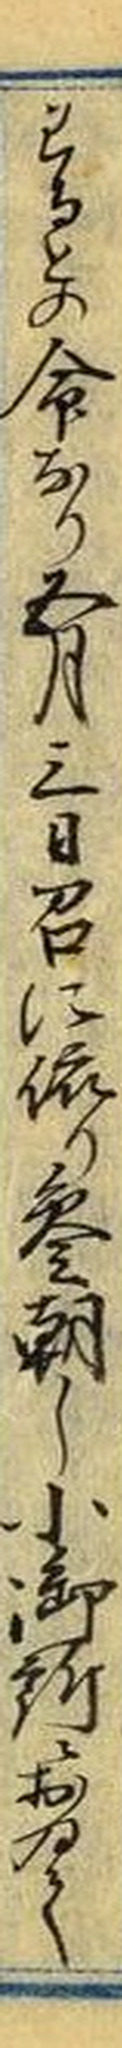わるとの命なり五月三日召に依り参朝し小御所ニおゐて
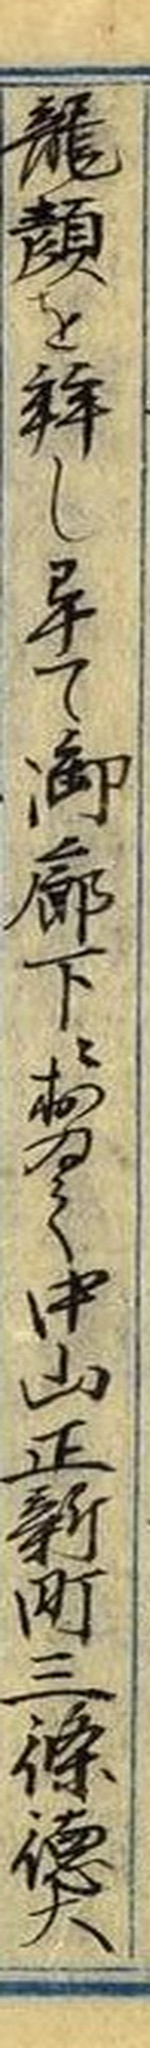龍顔を拝し畢て御廊下ニおゐて中山正新町三條徳大
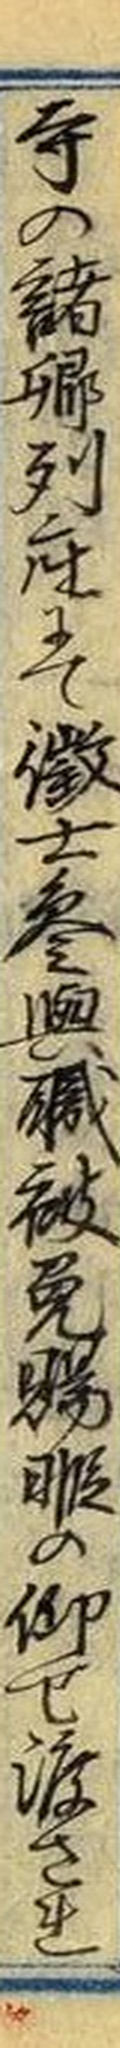寺の諸卿列座にて微士参与被免賜暇の仰せ渡され
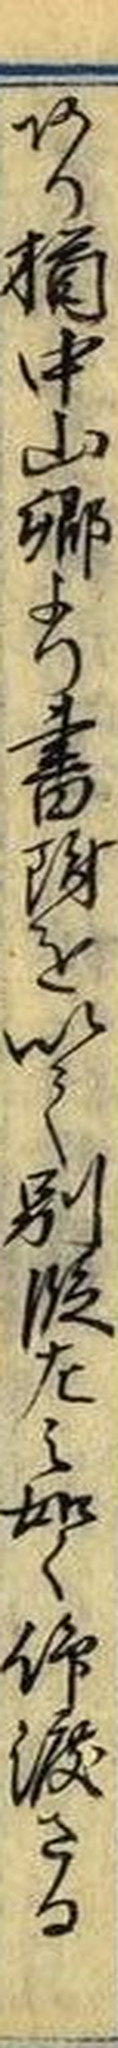あり猶中山卿より書付を以て別段左之如く仰渡さる
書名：温古集 三巻
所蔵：福井県文書館 Fukui Prefectural Archives
